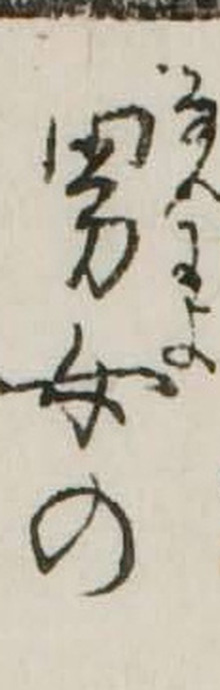男女の
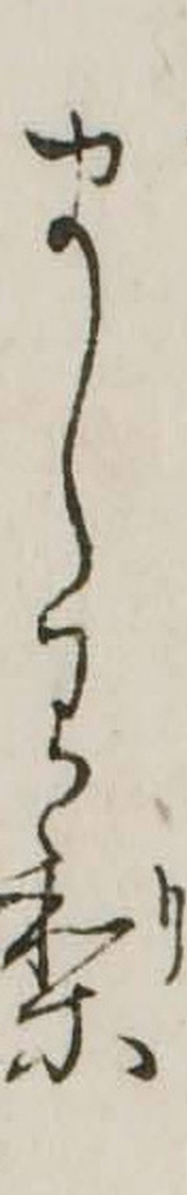ましわ梨
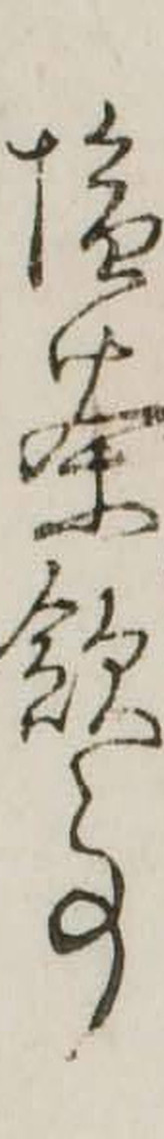塩茶飲事
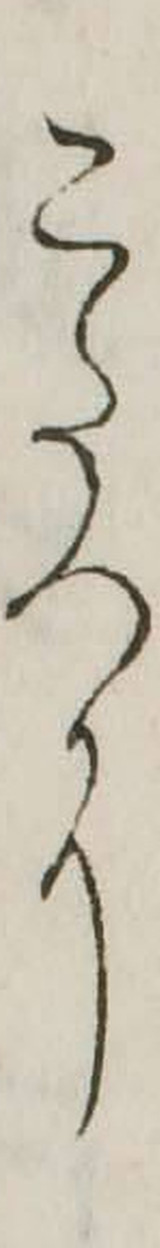こたつに
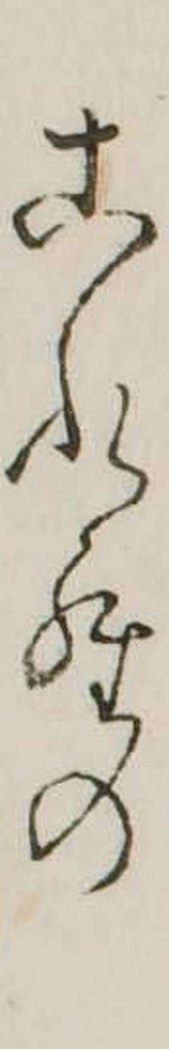これらの
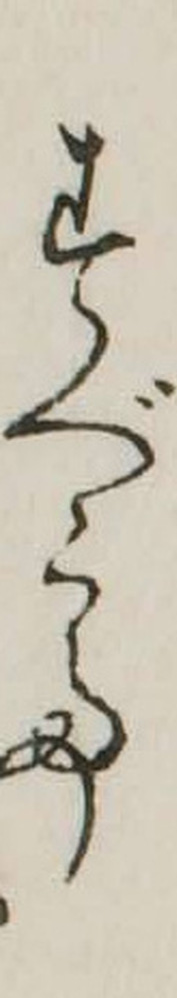すべて

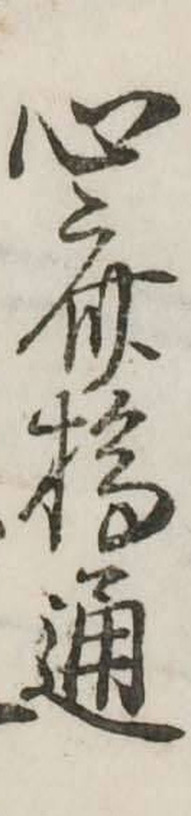心斎橋通
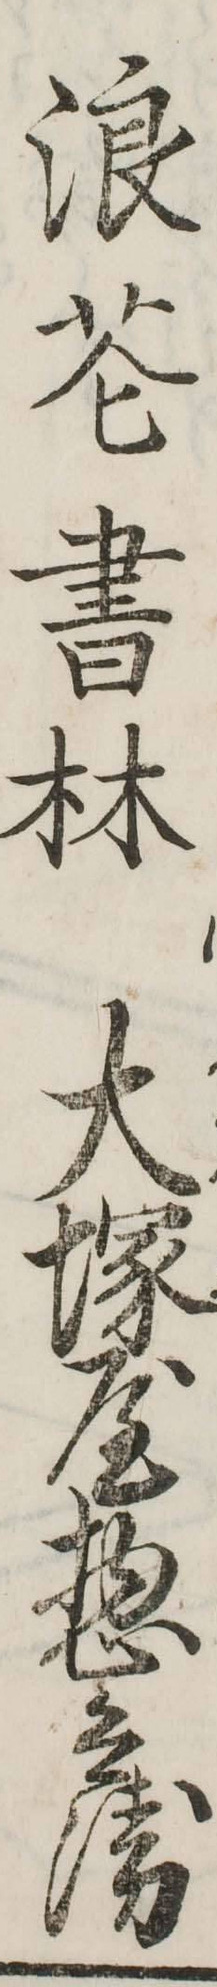浪花書林大塚屋惣兵衛
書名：繪本不盡泉
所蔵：国文学研究資料館
